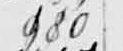980
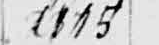2375
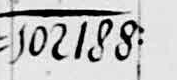102188
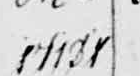17131
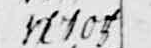12705
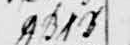9313
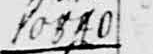10540
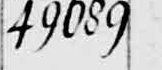49689
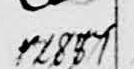12857
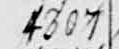4307
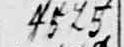4525
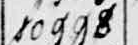10998
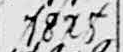7825
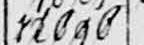12696
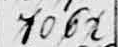7062
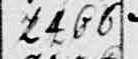2466
